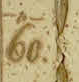60.
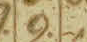9.
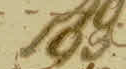193.
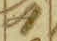4
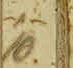10.
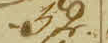32.
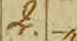2.
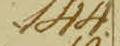144.
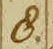8.
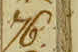76.
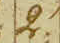2.
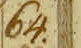64.
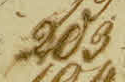203
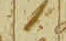1.
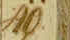40.
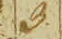3.
